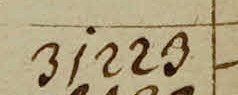31223
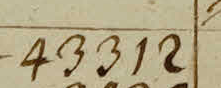43312
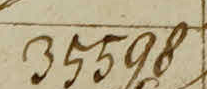35598
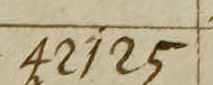42125
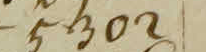5302
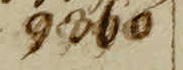9360
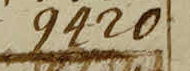9420
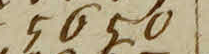5650
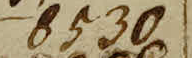8530
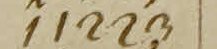11223
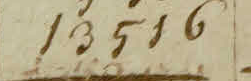13516
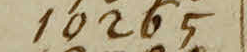10265
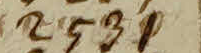2531
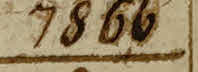7866
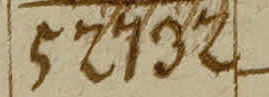52732
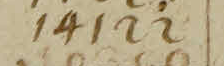14122
